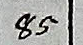85
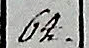64
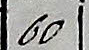60
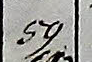59
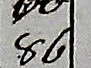86
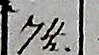74.
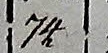74
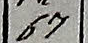67
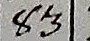83
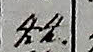44.
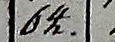64.
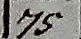75
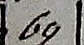69
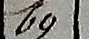69
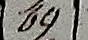69
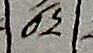62
